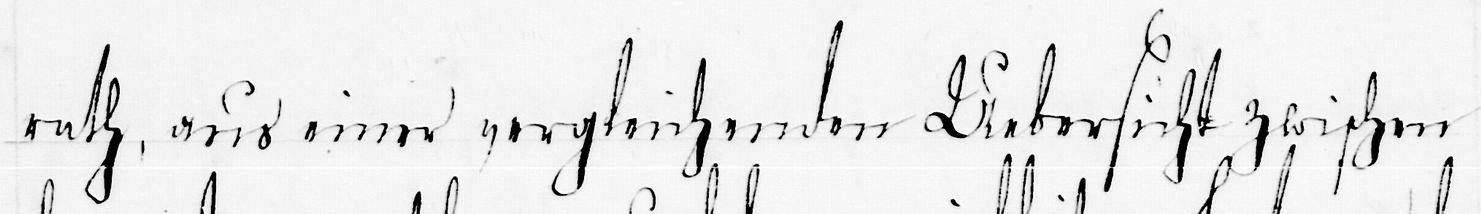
rath, aus einer vergleichenden Uebersicht zwischen
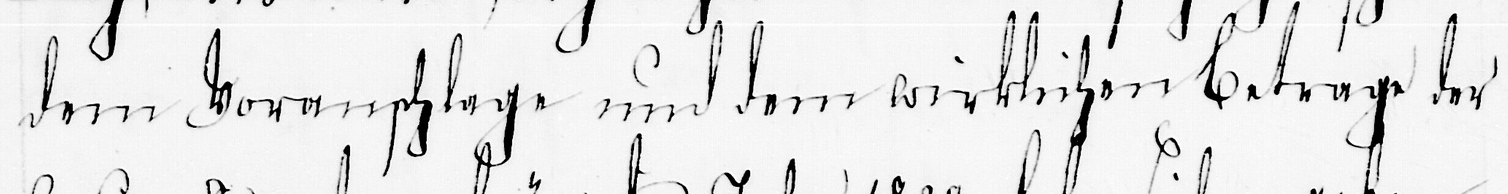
dem Voranschlage und dem wirklichen Betrage der
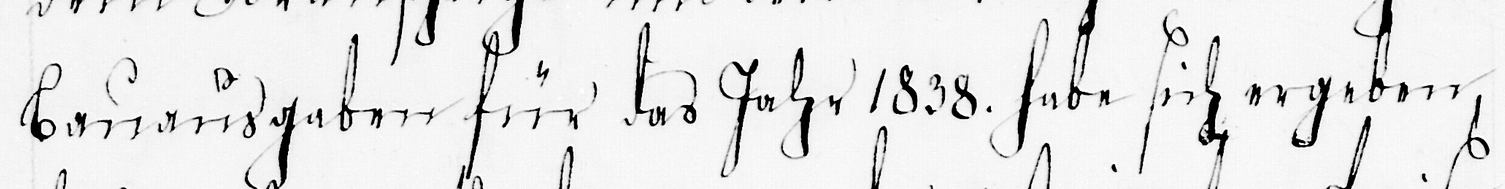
Bauausgaben für das Jahr 1838. habe sich ergeben,
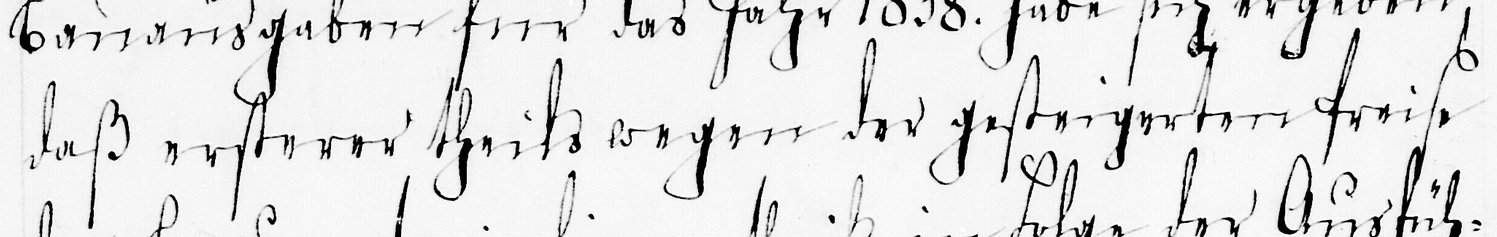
daß ersterer theils wegen der gesteigerten Preise
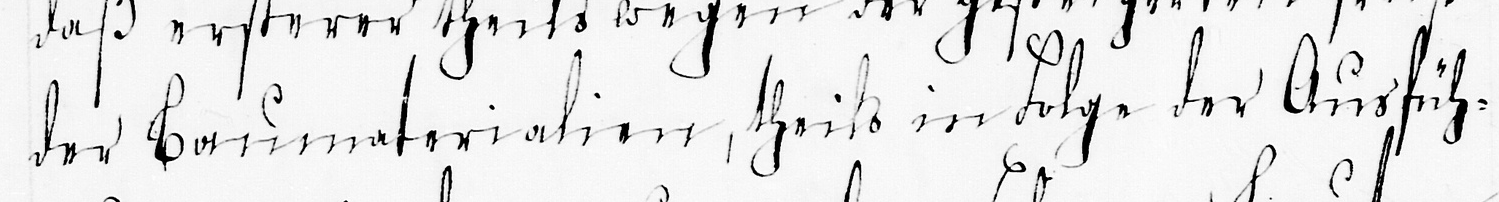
der Baumaterialien, theils in Folge der Ausfüh¬
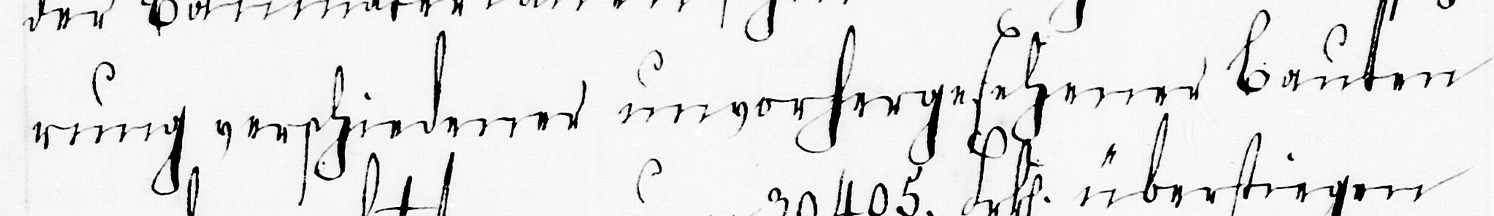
rung verschiedener unvorhergesehener Bauten
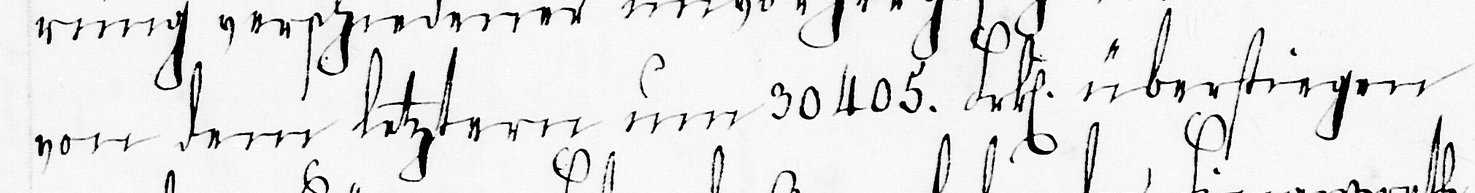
von dem letztern um 30 405. Frk[en]. überstiegen
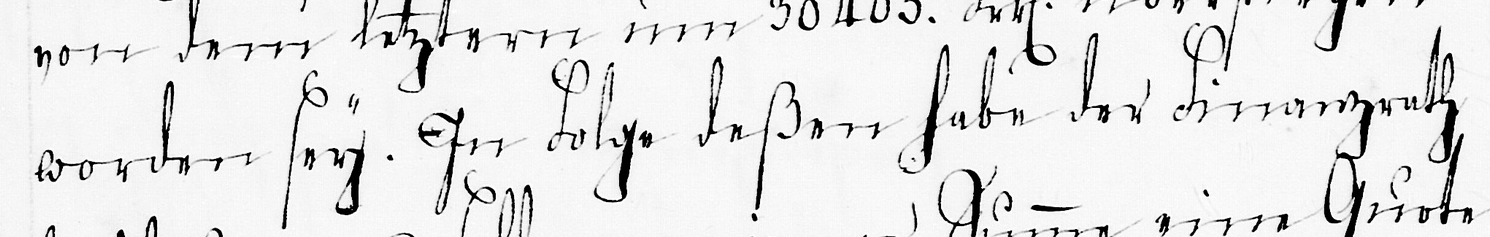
worden sey. In Folge deßen habe der Finanzrath
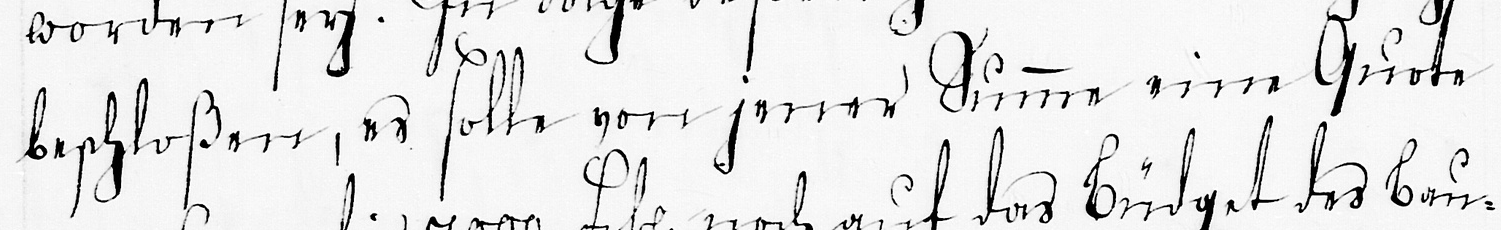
beschloßen, es solle von jener Summe eine Quote
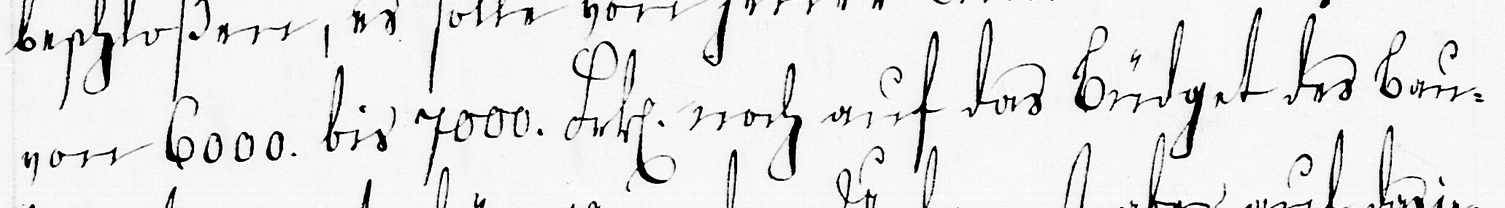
von 6000. bis 7000. Frk[en]. noch auf das Büdget des Bau¬
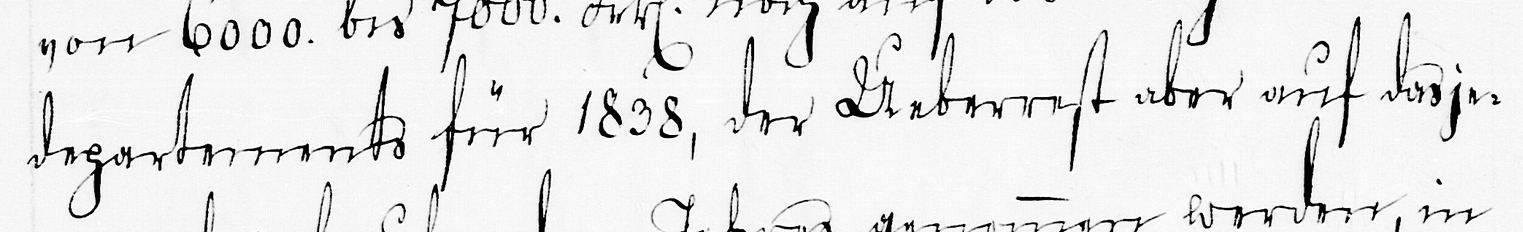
departements für 1838, der Ueberrest aber auf dasje¬
